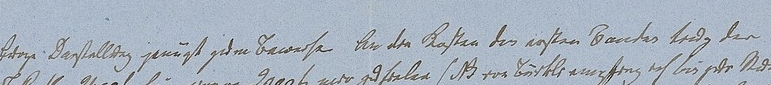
kurze Darstellung genügt zum Beweise. An die Kosten des ersten Bandes trug der
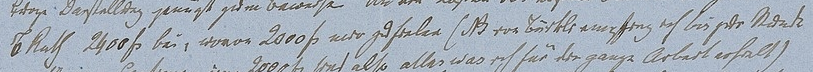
BRath 2400 fs bei, wovon 2000 fs mir zufielen (NB von Bürkli empfing ich bis zur Stunde
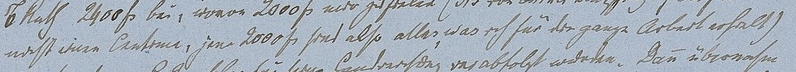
nicht einen Centime, jene 2000fs sind also alles, was ich für die ganze Arbeit erhielt)
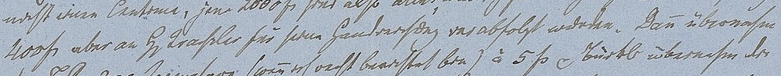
400fs aber an Hrn Trachsler für seine Handreichung verabfolgt wurden. Dann übernahm
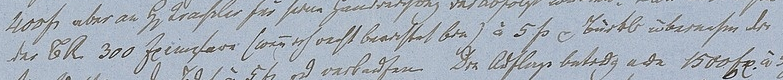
der BR. 300 Exemplare (wenn ich recht berichtet bin) à 5 fs & Bürkli übernahm die
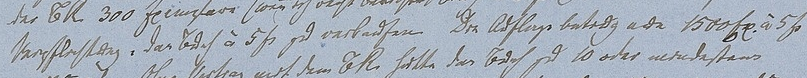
Verpflichtung, das Buch à 5 fs zu verkaufen. Die Auflage betrug nur 1500 Ex. à 5 fs
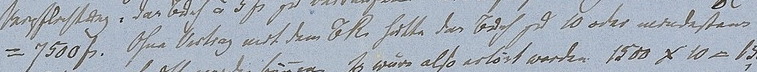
= 7500 fs. Ohne Vertrag mit dem BR. hätte das Buch zu 10 oder mindestens
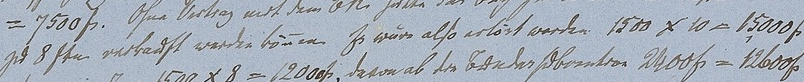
zu 8 fkn verkauft werden können. Es wäre also erlöst worden 1500 x 10 = 15000 fs
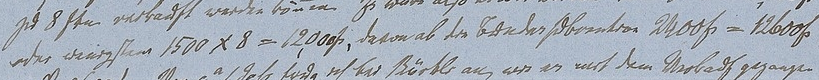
oder wenigstens 1500 x 8 = 12000 fs, davon ab die Bundessubvention 2400 fs = 12600 fs
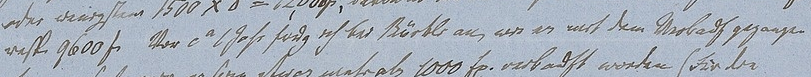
resp. 9600 f. Vor ca 1 Jahr frug ich bei Bürkli an, wie es mit dem Verkauf gegangen
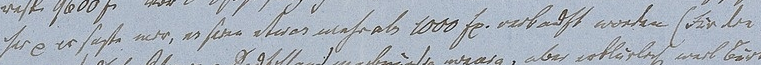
sei & er sagte mir, es seien etwas mehr als 1000 Ex. verkauft worden (für die
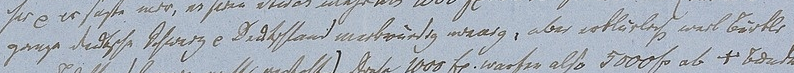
ganze deutsche Schweiz & Deutschland merkwürdig wenig, aber erklärlich, weil Bürkli
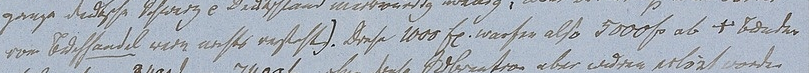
von Buchhandel rein nichts versteht). Diese 1000 Ex. warfen also 5000 fs ab + Bundes-
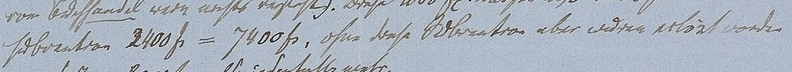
subvention 2400 fs = 7400 fs, ohne diese Subvention aber wären erlöst worden
